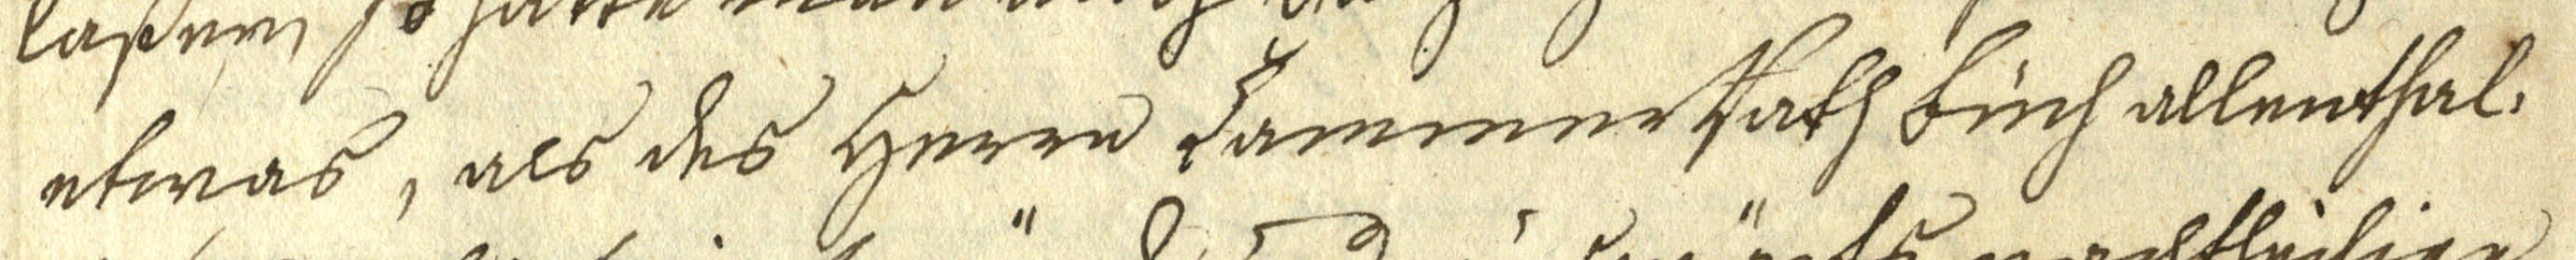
etwas, als des Herrn CammerRath Buch allenthal¬
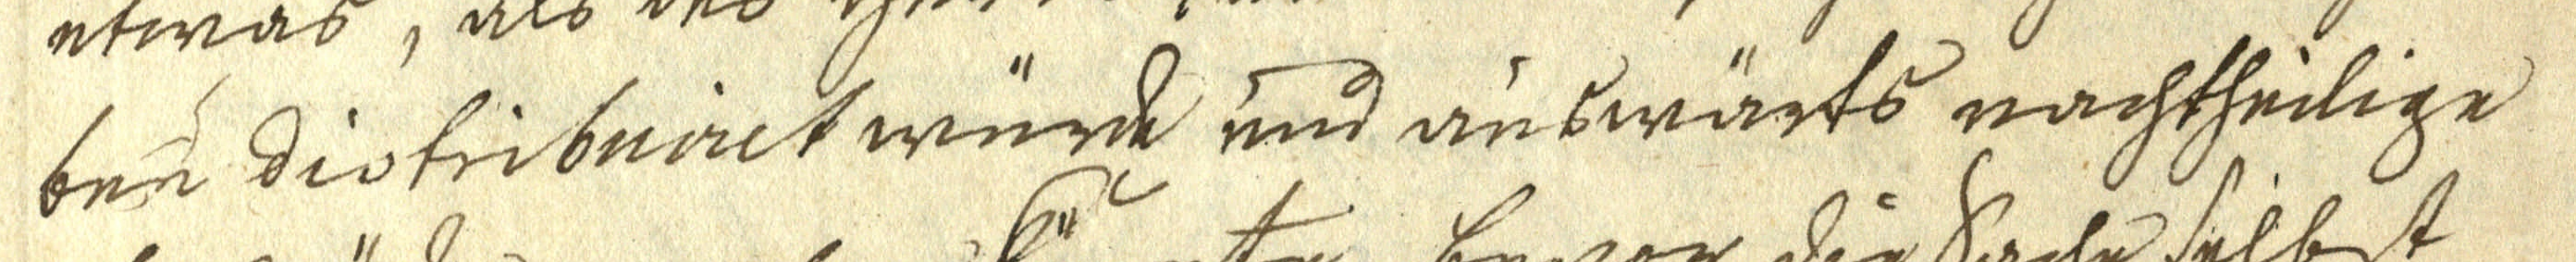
ben distribuiret würde und auswärts nachtheilige
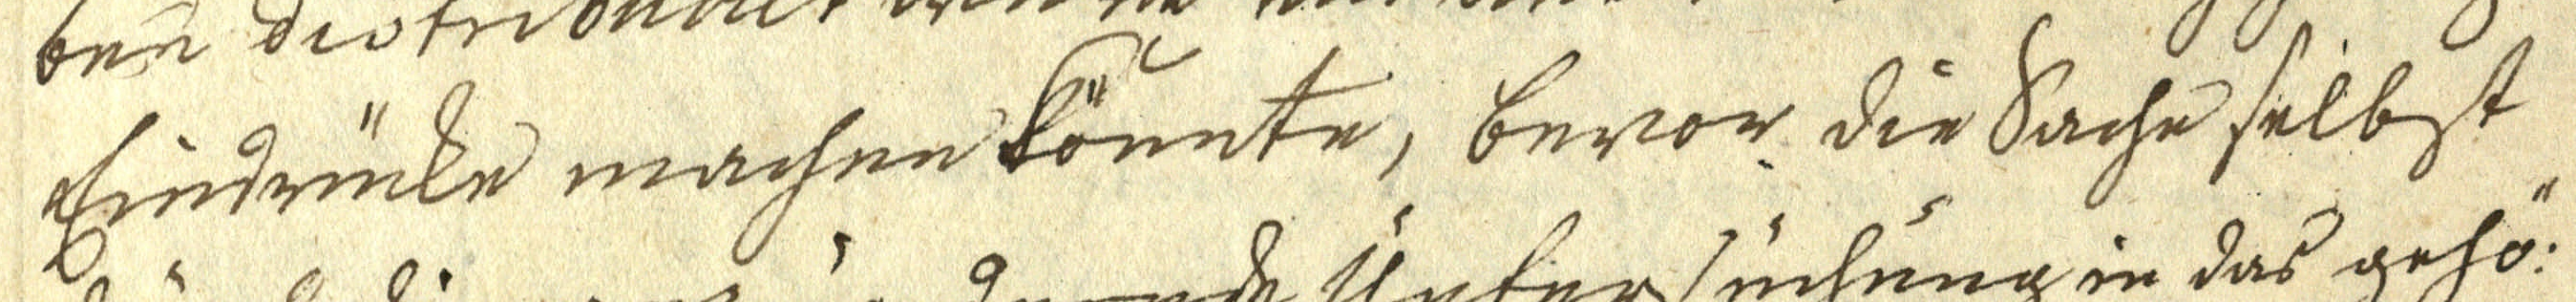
Endrücke machen könnte, bevor die Sache selbst
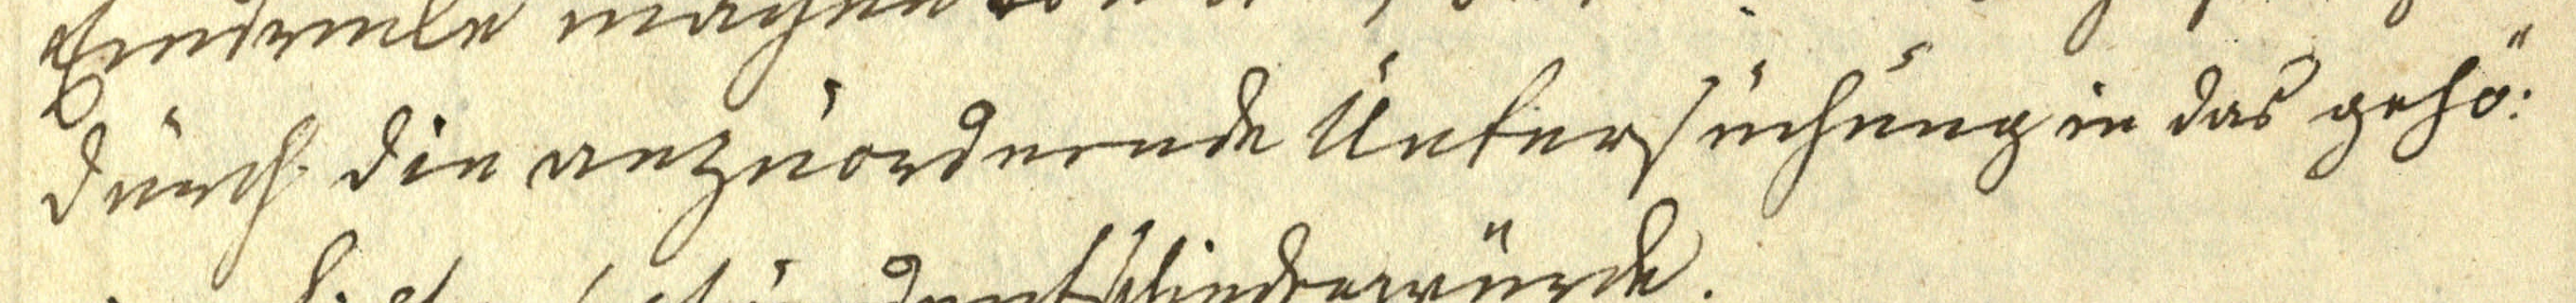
durch die anzuordnende Untersuchung in das gehö¬
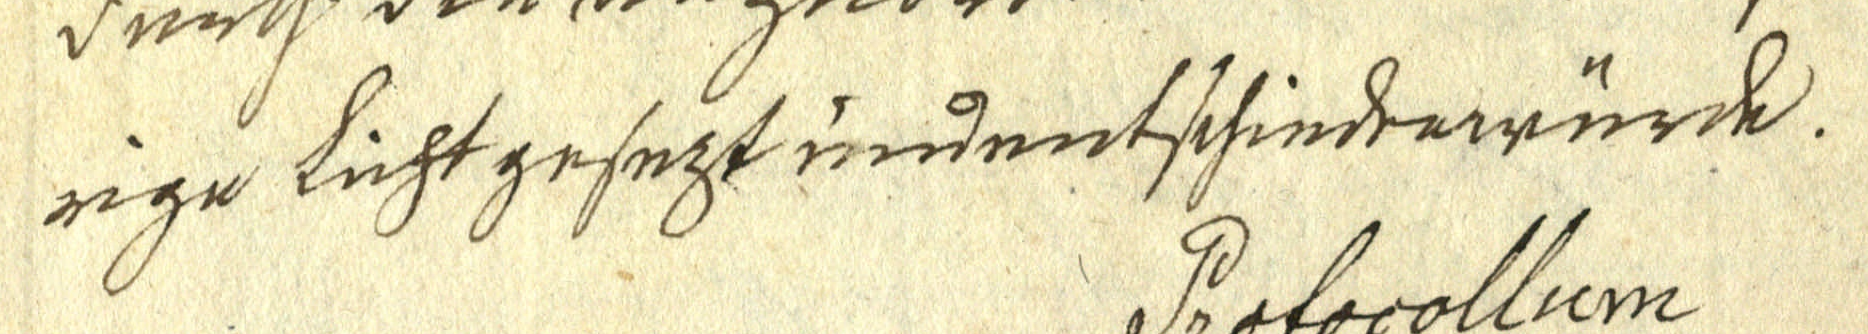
rige Licht gesezt und entschieden würde.
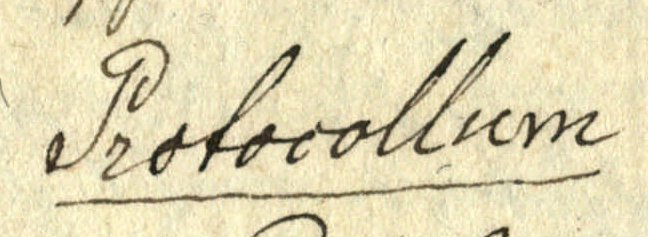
Protocollum
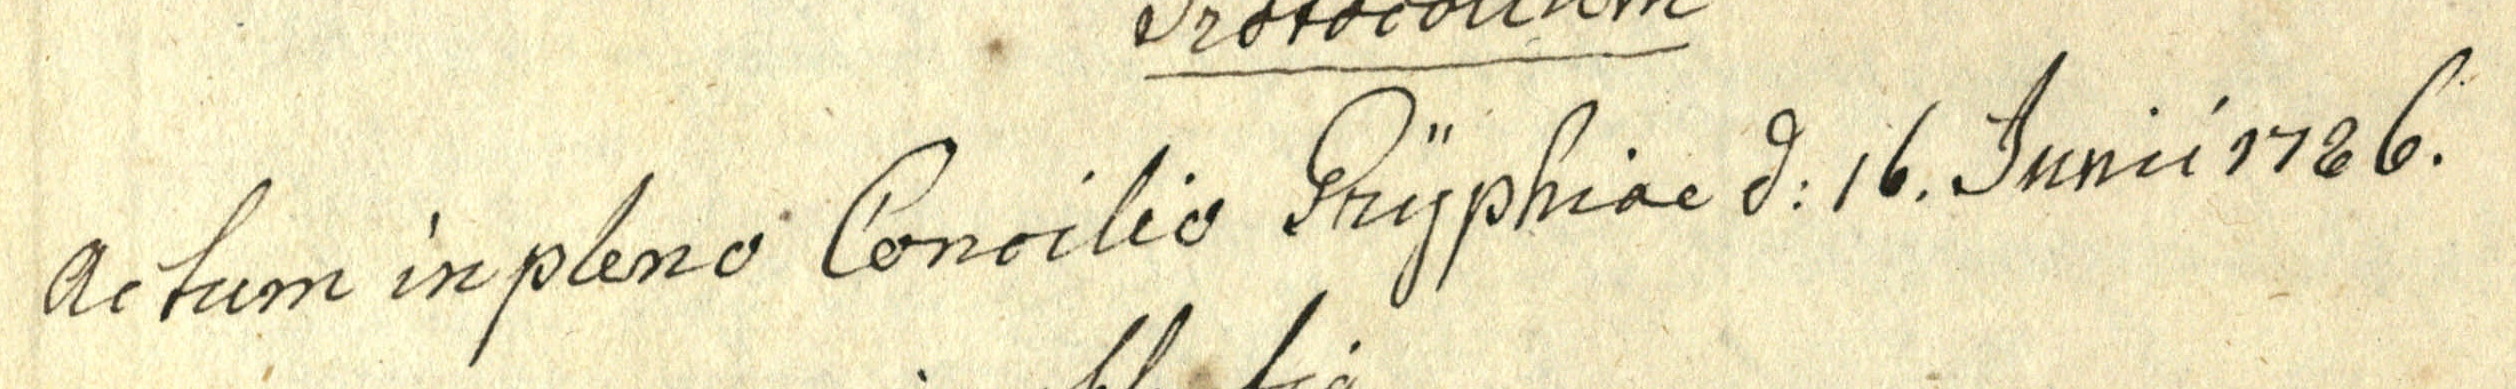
Actum in pleno Concilio Grÿphiae d. 16. Junii 1786.
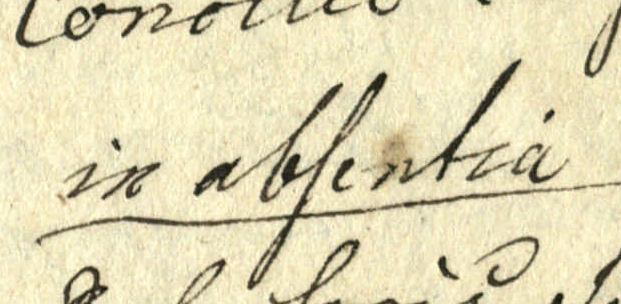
in absentia
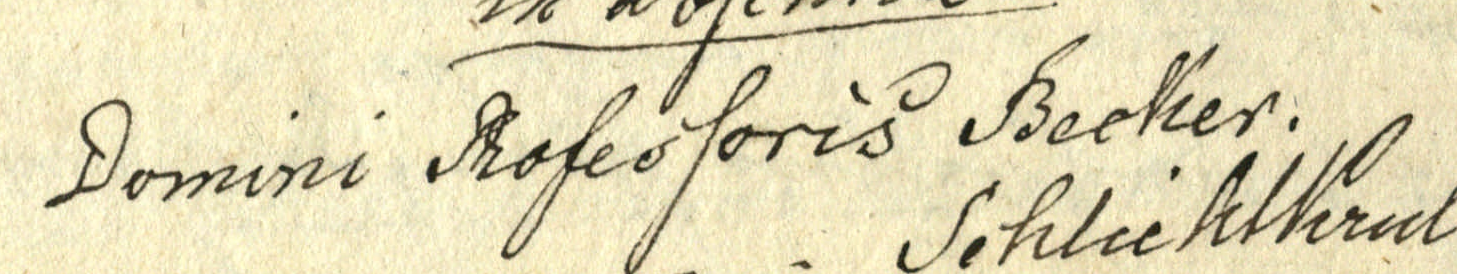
Domini Professoris Becker,
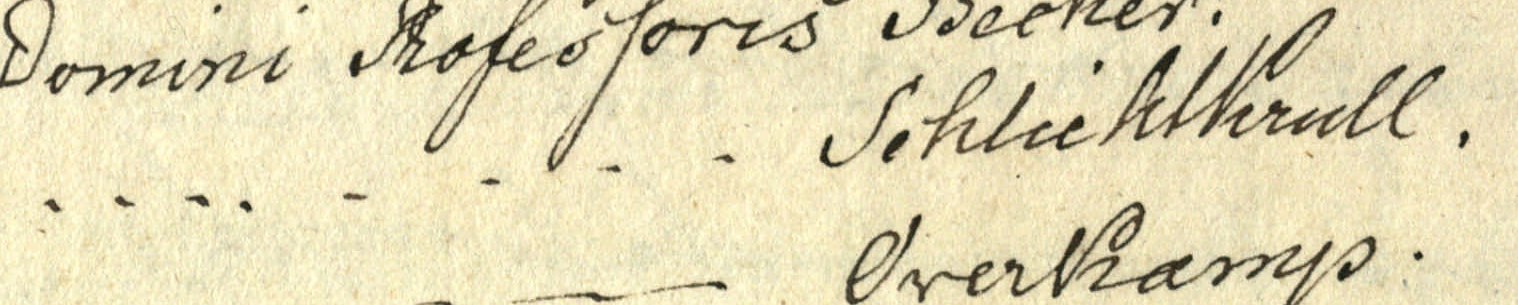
Schlichtkrull.
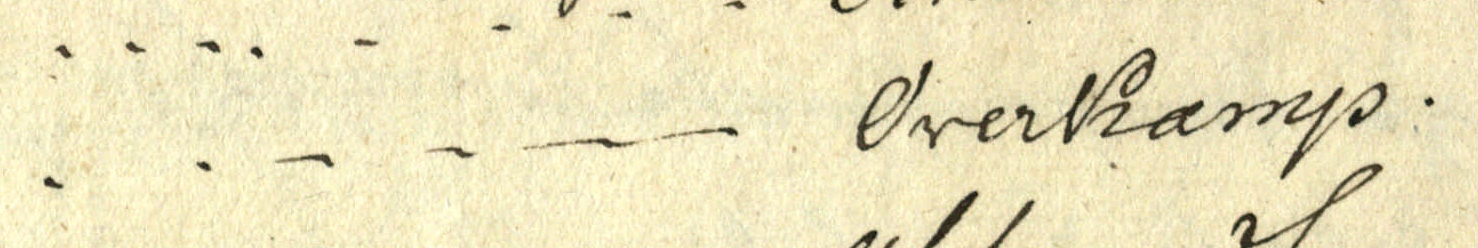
Overkamp.
